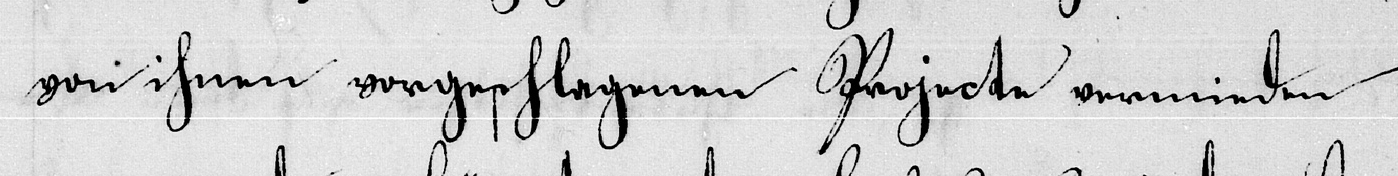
von ihnen vorgeschlagenen Projecte vermieden
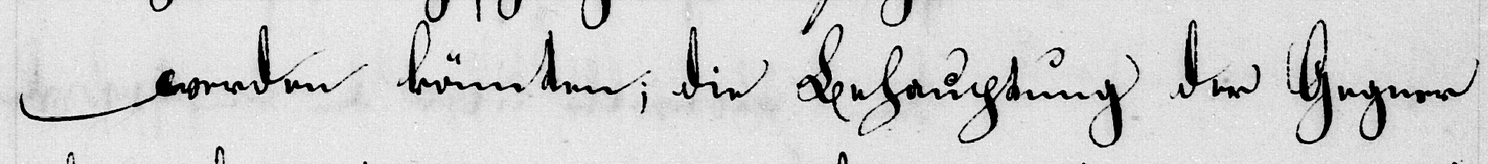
werden könnten; die Behauptung der Gegner
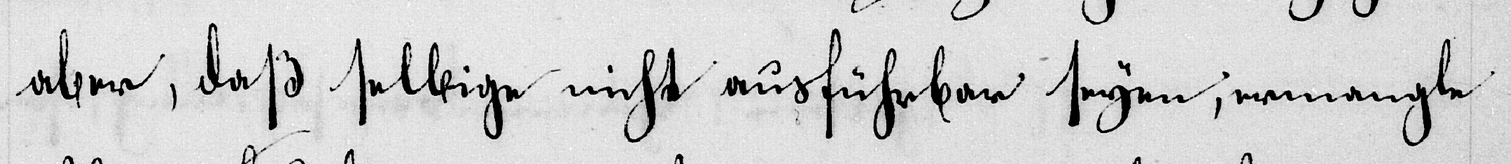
aber, daß selbige nicht ausführbar seyen, ermangle
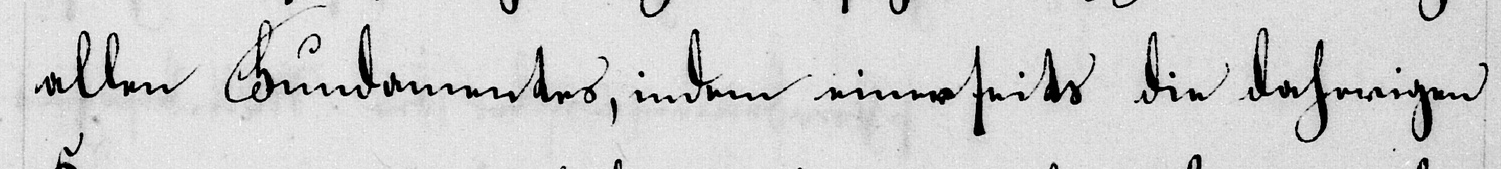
allen Fundamentes, indem einerseits die daherigen
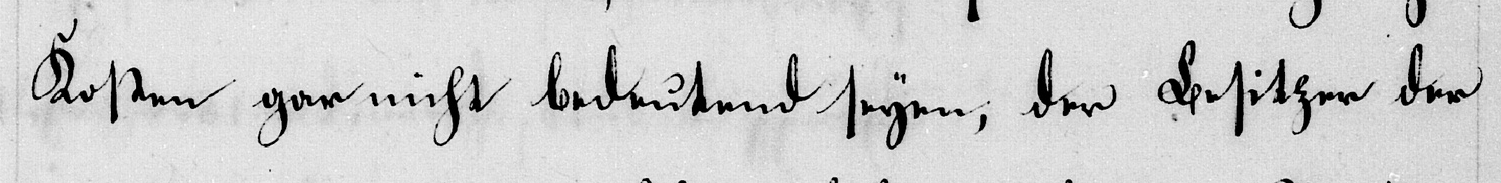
Kosten gar nicht bedeutend seyen, der Besitzer der
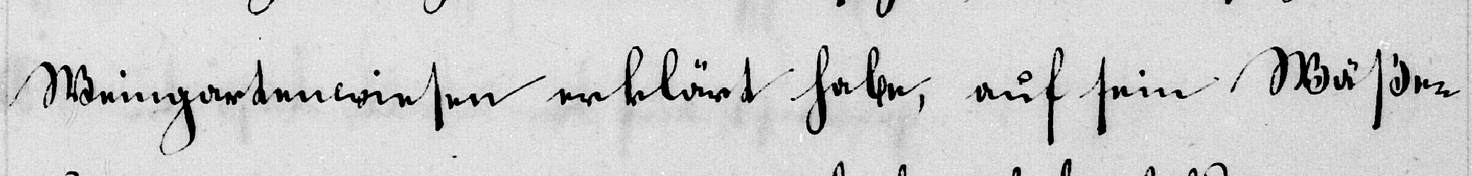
Weingartenwiesen erklärt habe, auf sein Wäße¬
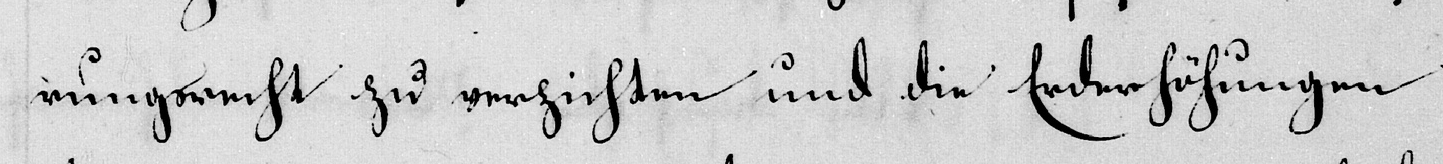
rungsrecht zu verzichten und die Erderhöhungen
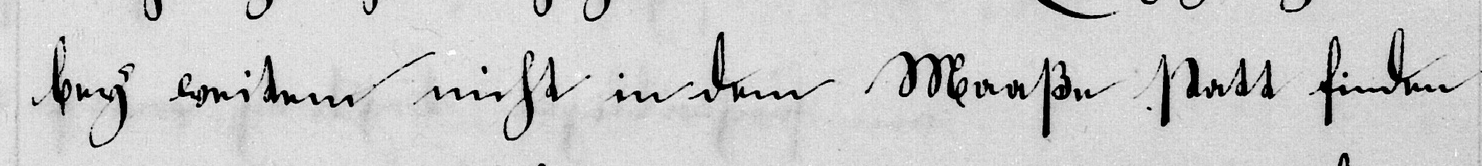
bey weitem nicht in dem Maaße statt finden
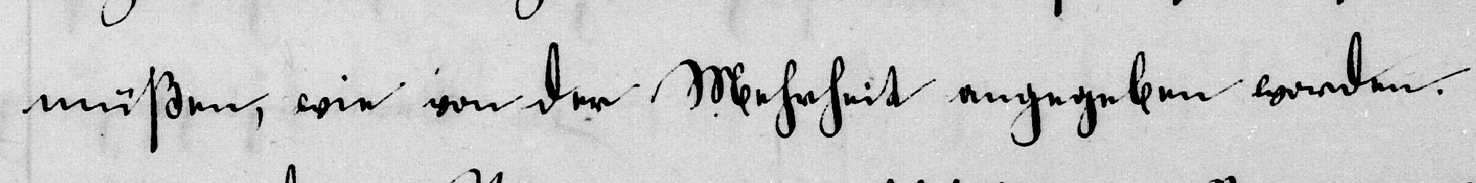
müßen, wie von der Mehrheit angegeben worden.
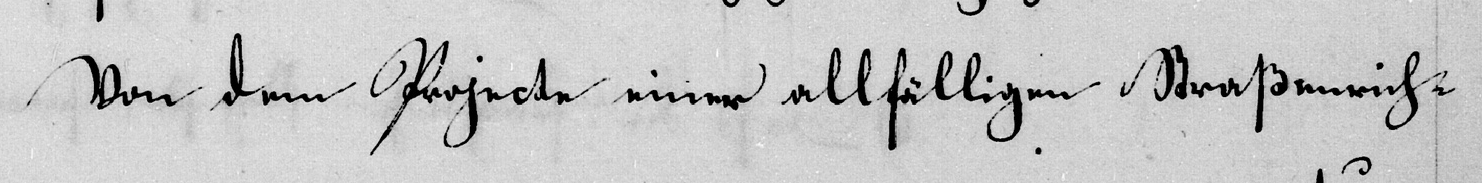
Von dem Projecte einer allfälligen Straßenrich-
